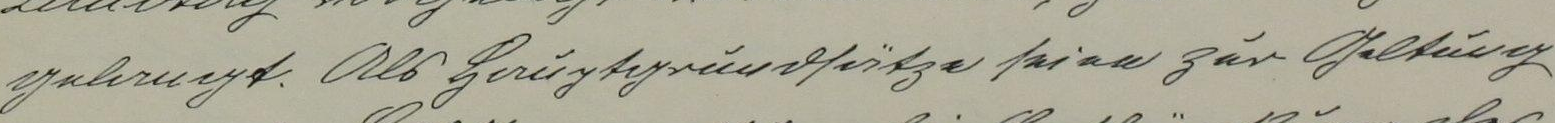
gelangt. Als Hauptgrundsätze seien zur Geltung
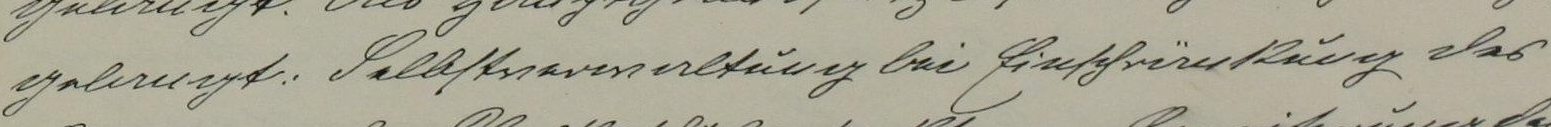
gelangt: Selbstverwaltung bei Einschränkung des
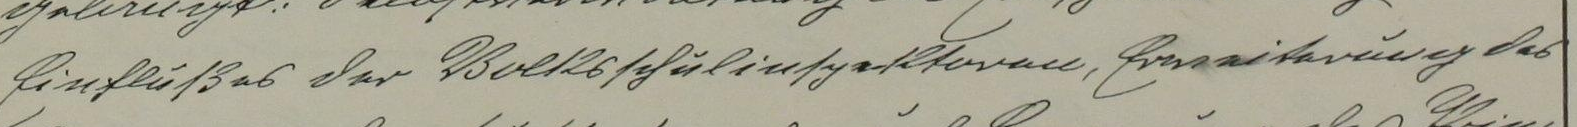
Einflußes der Volksschulinspektoren, Erweiterung des
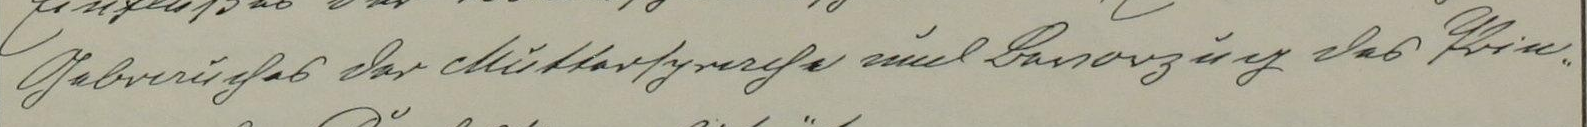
Gebrauches der Muttersprache und Bevorzug des Prin-
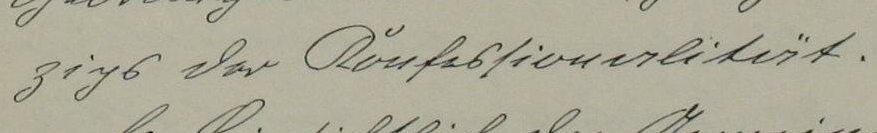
zips der Konfessionalität.
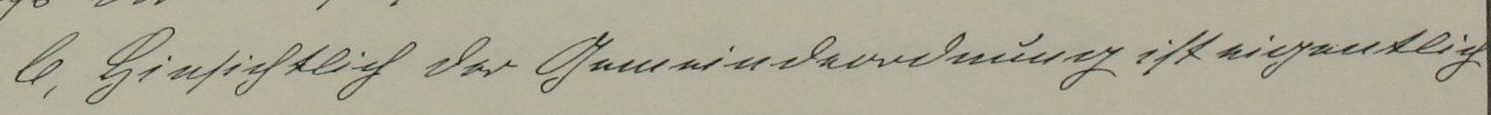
b. Hinsichtlich der Gemeindeordnung ist eigentlich
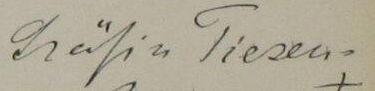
Gräfin Tiesen-
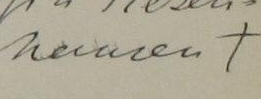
hausen †
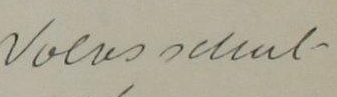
Volksschul
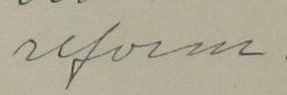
reform
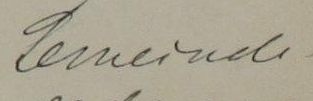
Gemeinde
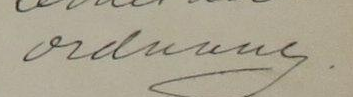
ordnung
